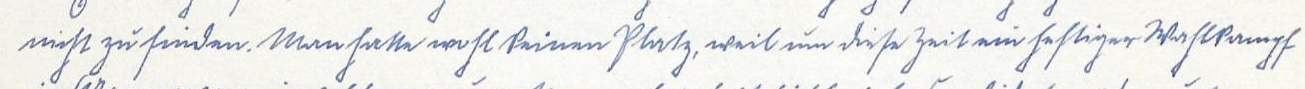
nicht zu finden. Man hatte wohl keinen Platz, weil um diese Zeit ein heftiger Wahlkampf
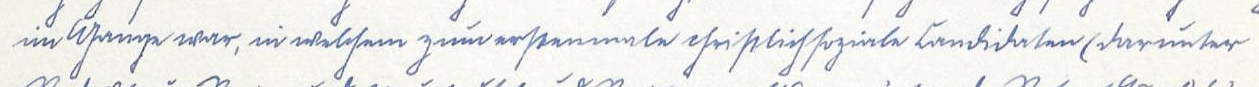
im Gange war, in welchem zum erstenmale christlichsoziale Candidaten (darunter
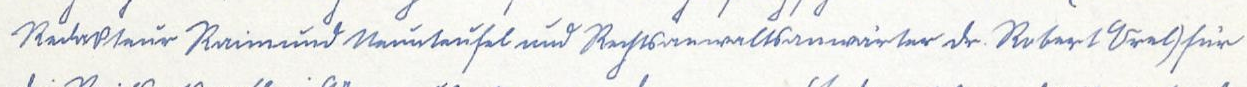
Redakteur Raimund Neunteufel und Rechtsanwaltsanwärter Dr. Robert Orel für
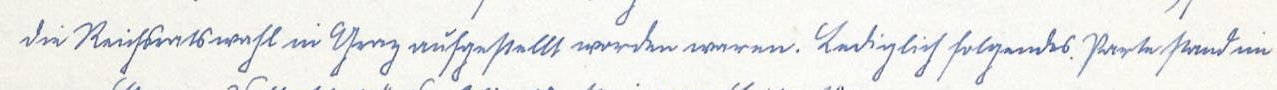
Die Reichsratswahl in Graz aufgestellt worden waren. Lediglich folgendes Parte stand im
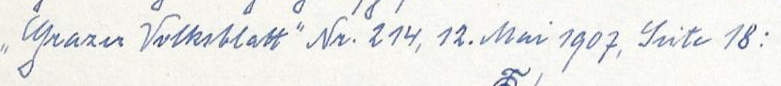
"Grazer Volksblatt" Nr. 214, 12. Mai 1907, Seite 18:
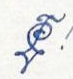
CL!
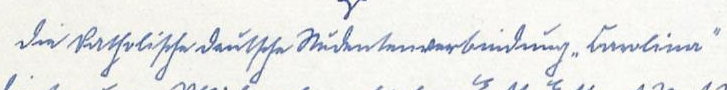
Die katholische deutsche Studentenverbindung „Carolina“
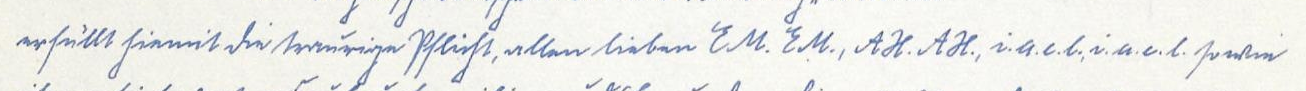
erfüllt hiemit die traurige Pflicht, allen lieben EM EM,AH AH, i.a.c.l., i.a.c.l sowie Aet. A i.. e. l. i. . e.l. sowie
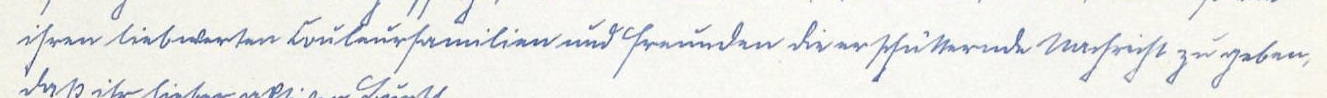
ihren liebwerten Couleurfamilien und Freunden die erschütternde Nachricht zu geben,
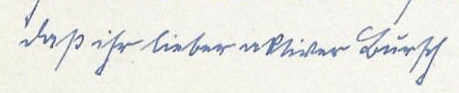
daß ihr lieber aktiver Bursch
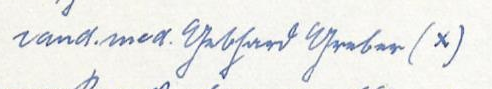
cand. med. Gebhard Greber (x)
